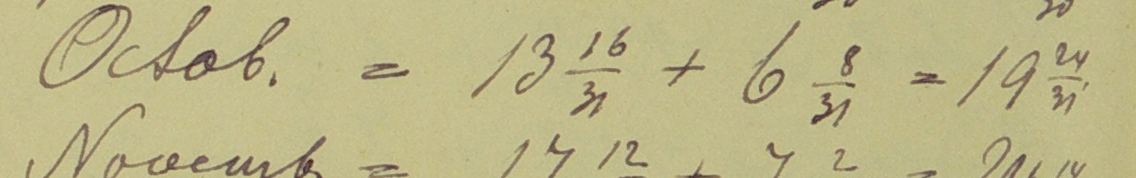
Octob. = 13 16/31 + 6 8/31 = 19 24/31
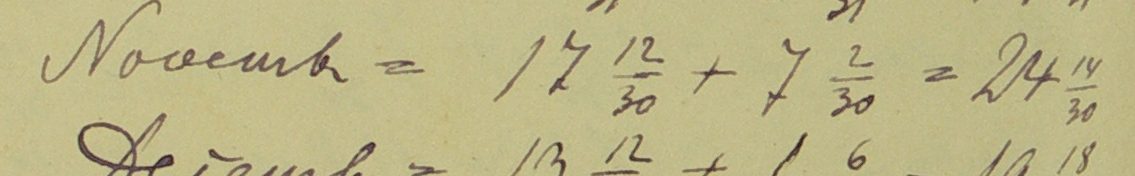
Novem. = 17 12/30 + 7 2/30 = 24 14/30
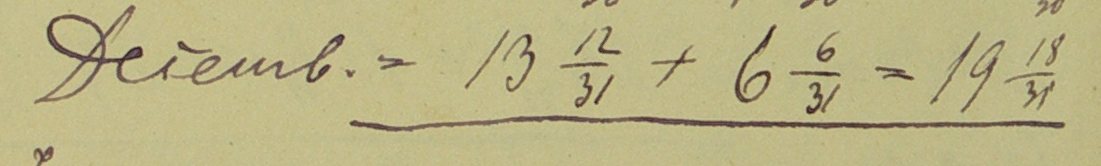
Decem. = 13 12/31 + 6 6/31 = 19 18/31
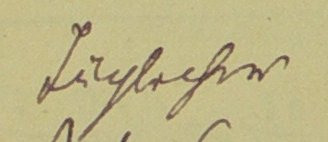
Täglicher
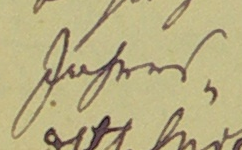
Jahres-
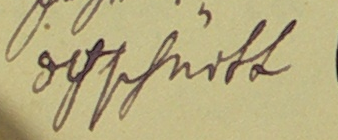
Durchschnitt
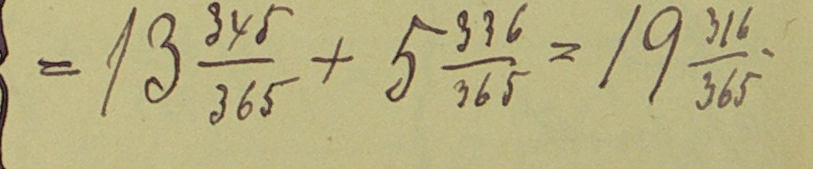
= 13 345/365 + 5 336/365 = 19 316/365
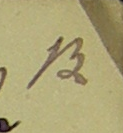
13
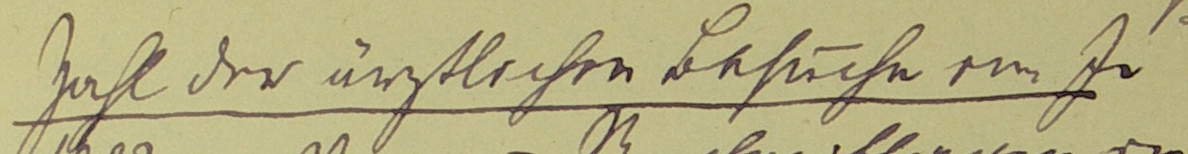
Zahl der ärztlichen Besuche im Jahre
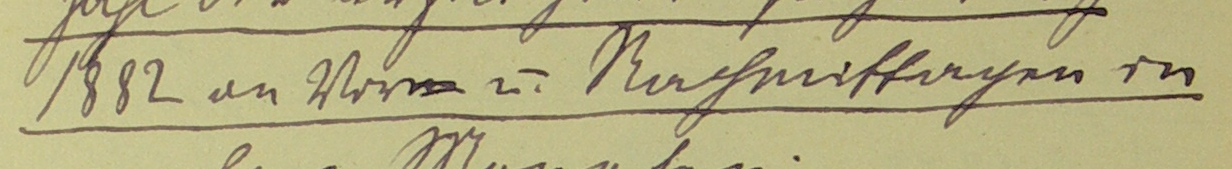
1882 an Vormittag- u. Nachmittagen in
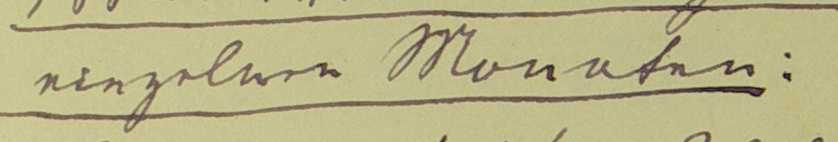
einzelnen Monaten:
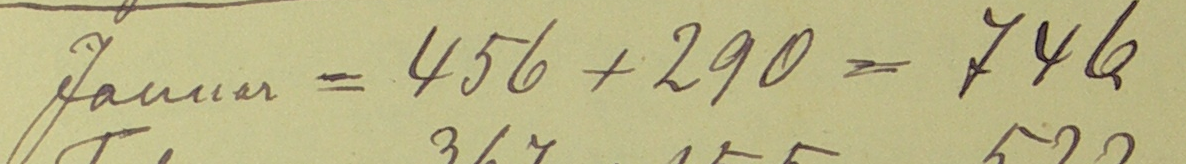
Januar = 456 + 290 = 746
